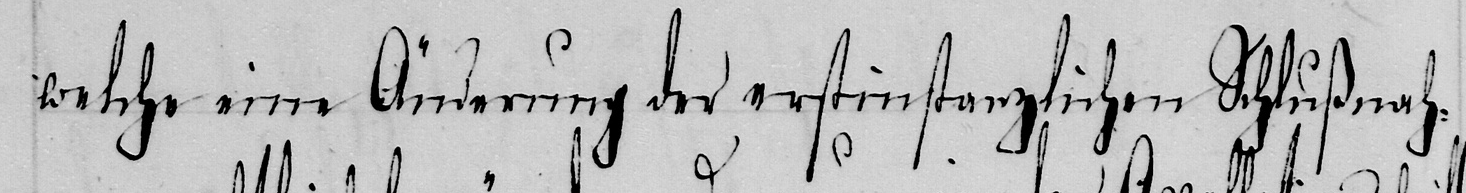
welche eine Abänderung der erstinstanzlichen Schlußnah¬
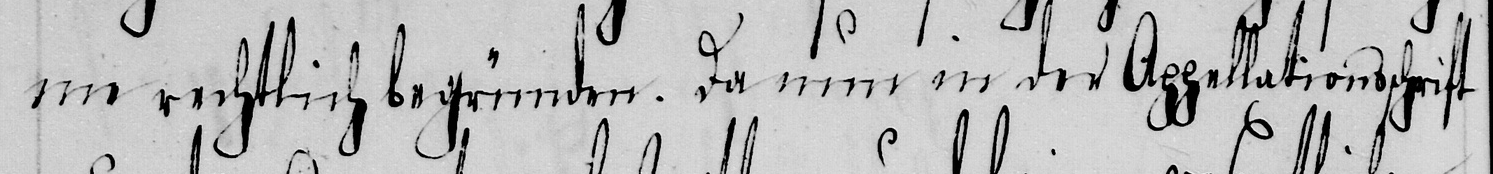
me rechtlich begründen. Da nun in der Appellationsschri¬
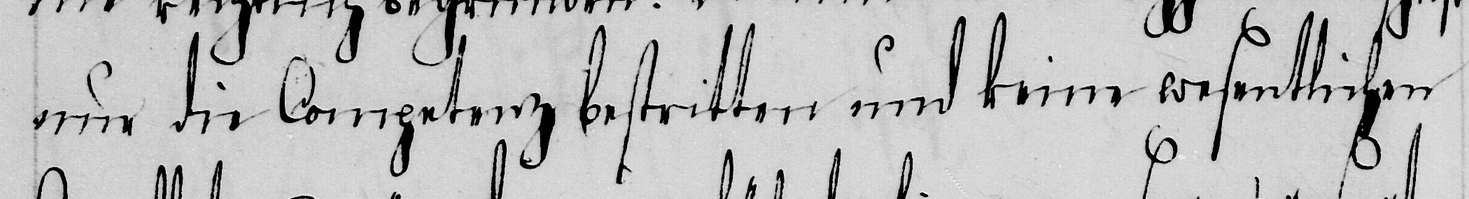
nur die Competenz bestritten und keine wesentlichen
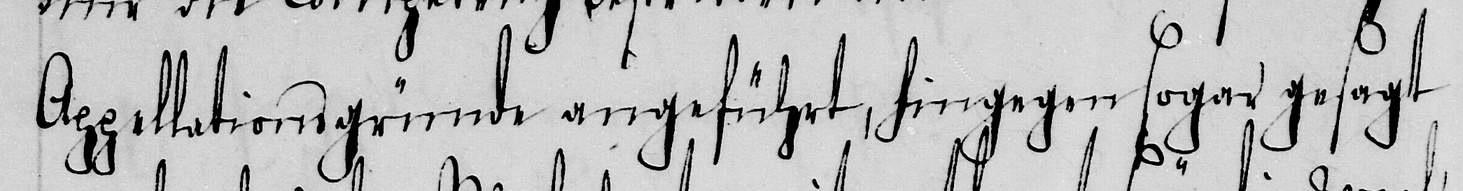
Appellationsgründe angeführt, hingegen sogar gesagt
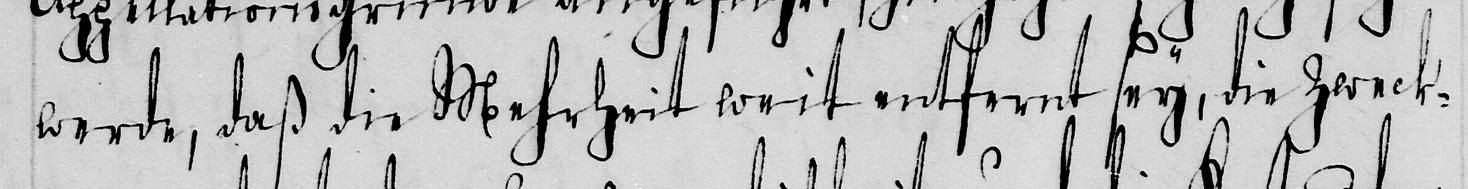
werde, daß die Mehrheit weit entfernt sey, die Zweck¬
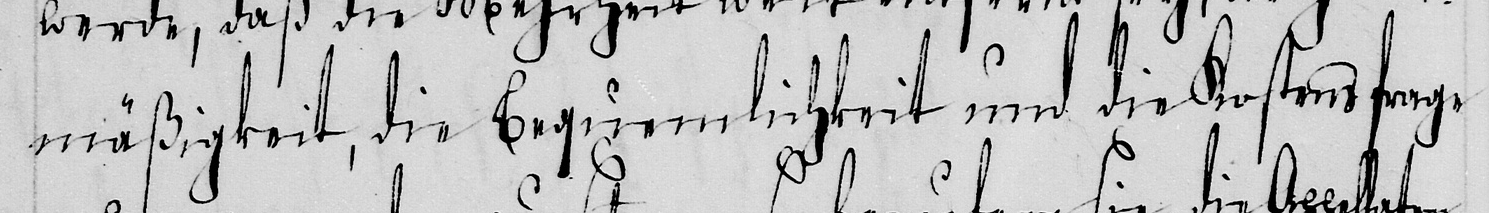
mäßigkeit, die Bequemlichkeit und die Kostensfrage
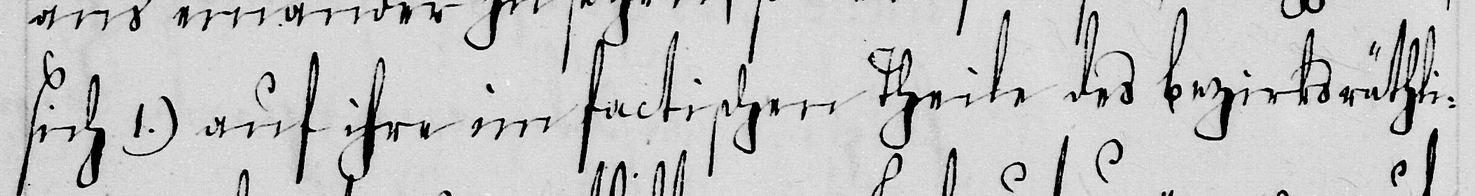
sich 1.) auf ihre im factischen Theile des bezirksräthl¬
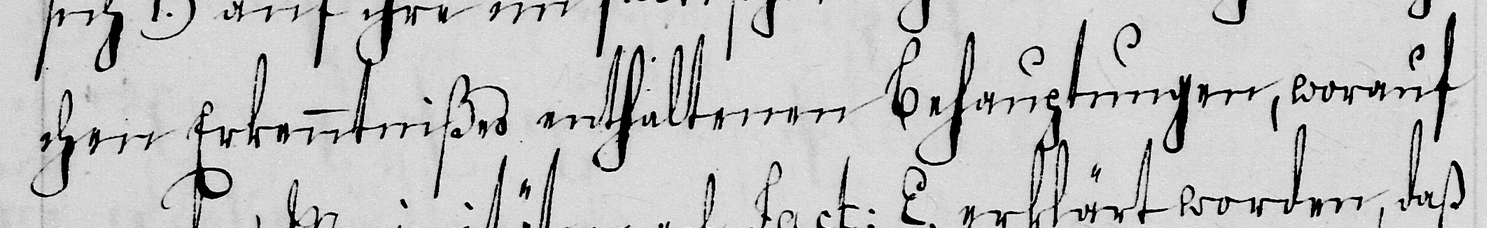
ichen Erkenntnißes enthaltenen Behauptungen, worauf
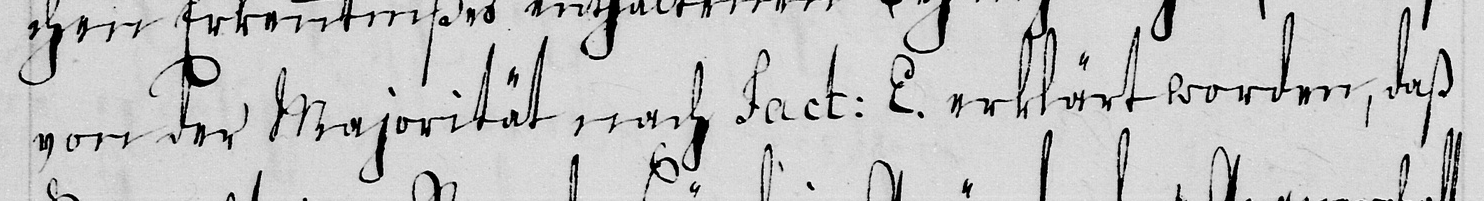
von der Majorität nach Fact: E. erklärt worden, daß
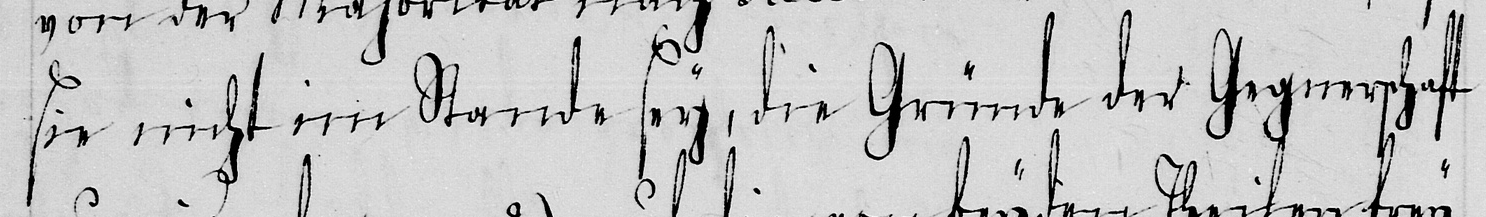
sie nicht im Stande sey, die Gründe der Gegnerschaft
